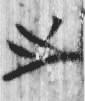之
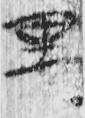里
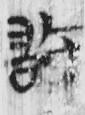敢
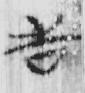告
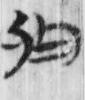於
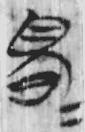視
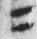日
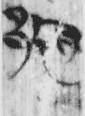陰
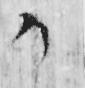人
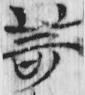苛
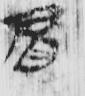冒
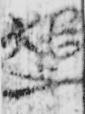○（宣）
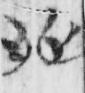卯
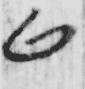㠯（以）
